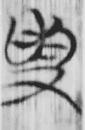受
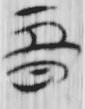○（期）
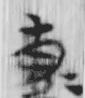十月
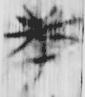未
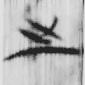之
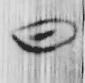日
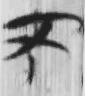不
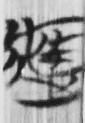𬨭（將）
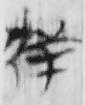○（射）
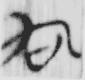叴
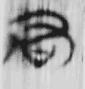君
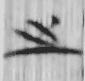之
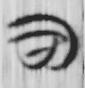司
